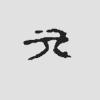亓（其）
